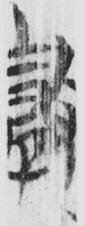○（穀）
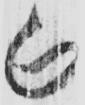㠯（以）
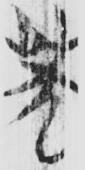○（笑）
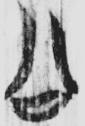公
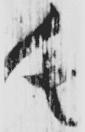氏（是）
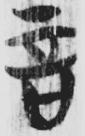言
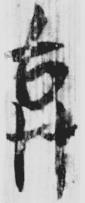棄
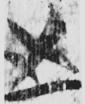之
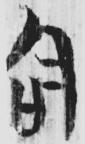含（今）
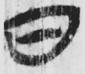日
